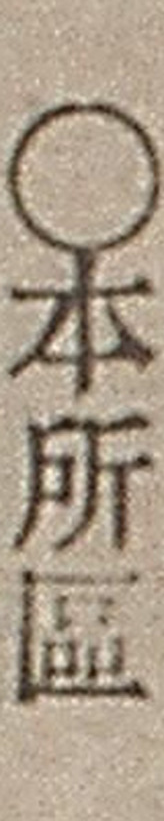〇本所区
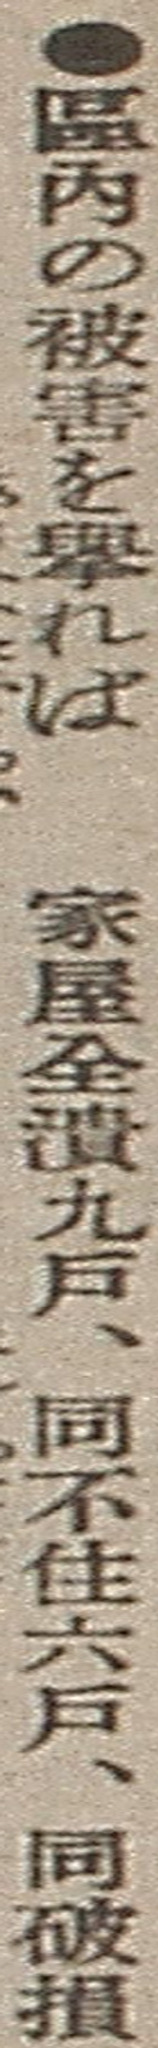●区内の被害を挙れば家屋全潰九戸、同不住六戸、同破損
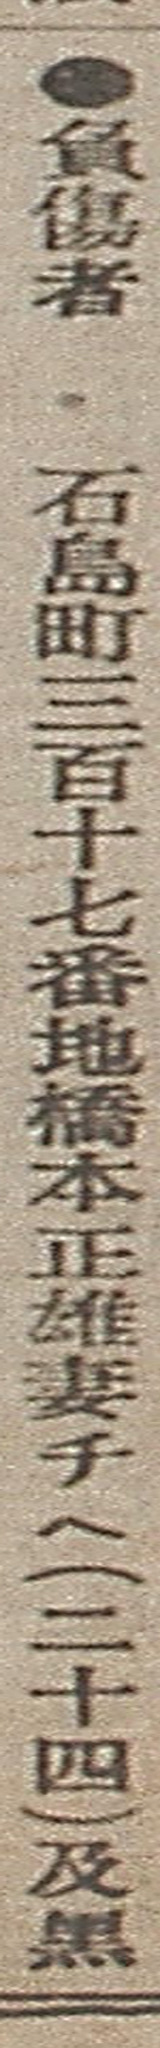●負傷者石島町三百重七番地橋本正雄妻チヘ及黒
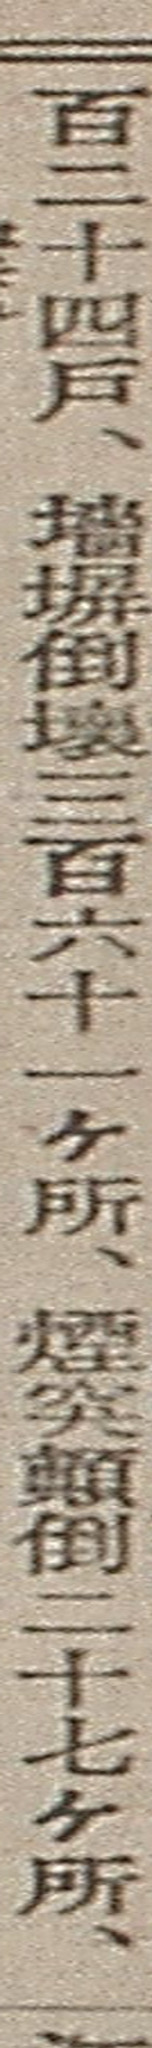百二十四戸、墻塀倒壊三百六十一ケ所、煙突顛倒二十七ケ所、
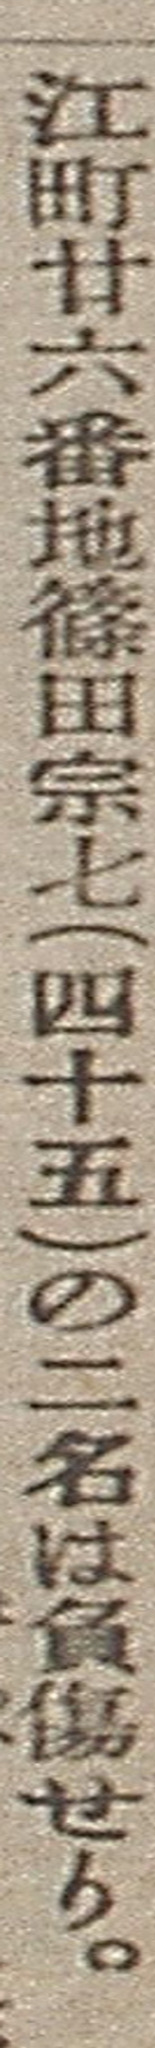江町廿六番地篠田宗七の二名は負傷せり。
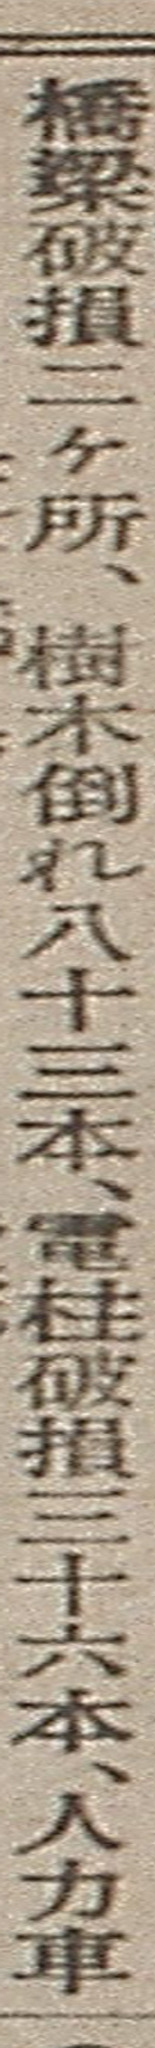橋梁破損二ケ所、樹木倒れ八十三本、電柱破損三十六本、人力車
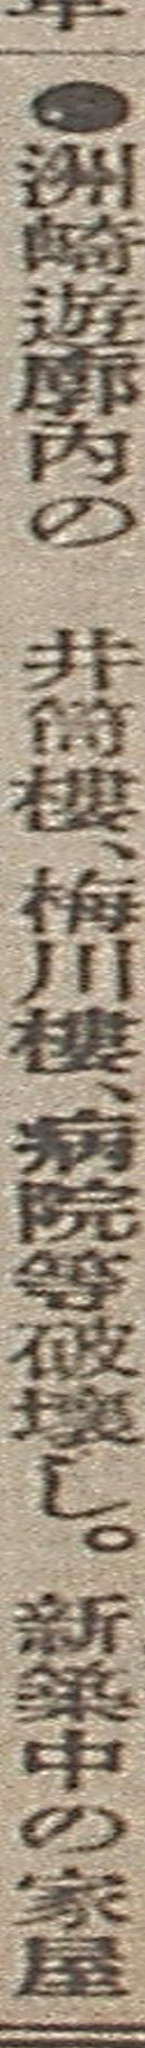●洲崎遊廓内の井筒楼、梅川楼、病院等破壊し。新築中の家屋
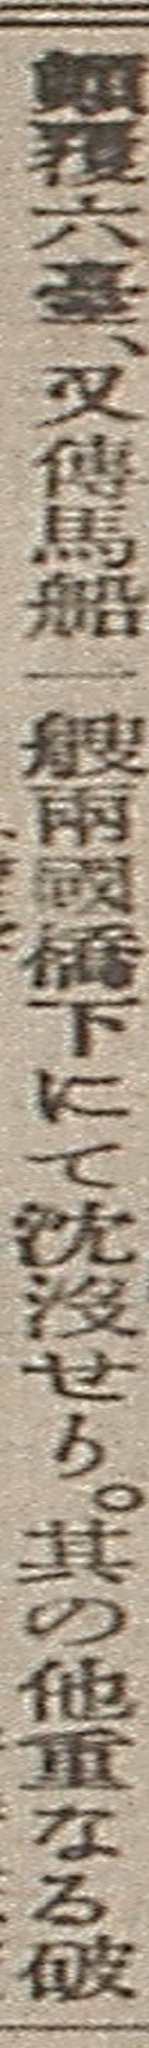顛覆六台、又伝馬船一艘両国橋下にて沈没せり。其の他重なる破
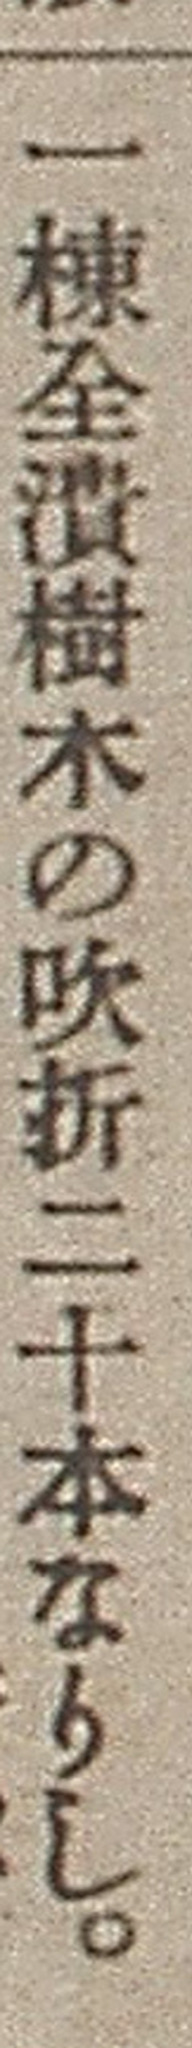一棟全潰樹木の吹折ニ十本なりし。
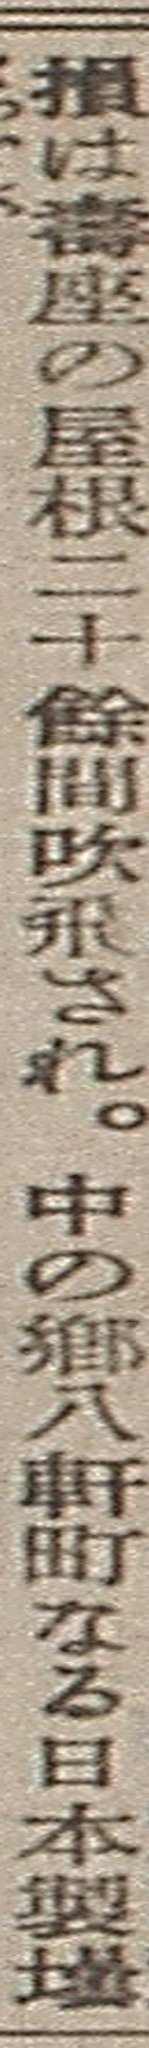損は寿座の屋根二十余間吹飛され。中の郷八軒町なる日本製壜
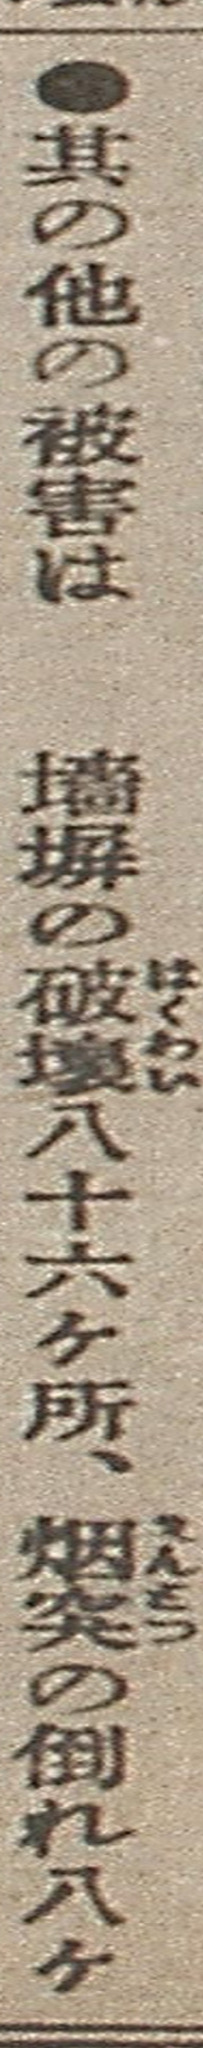●其の他の被害は墻塀の破壊八十六ケ所、烟突の倒れ八ケ
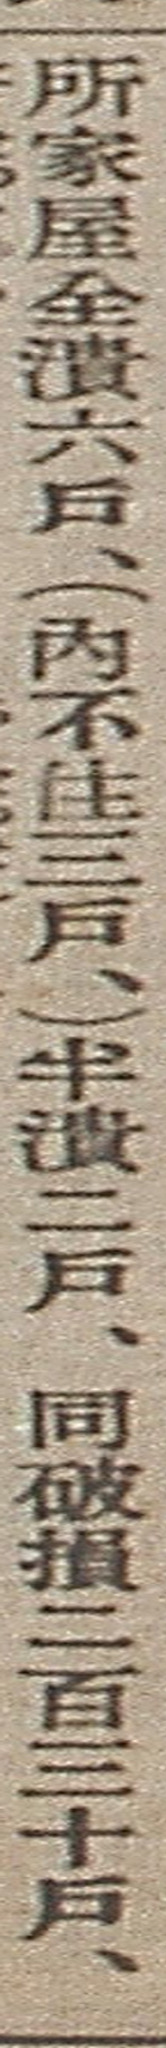所家屋全潰六戸、半潰二戸、同破損二百三十戸、
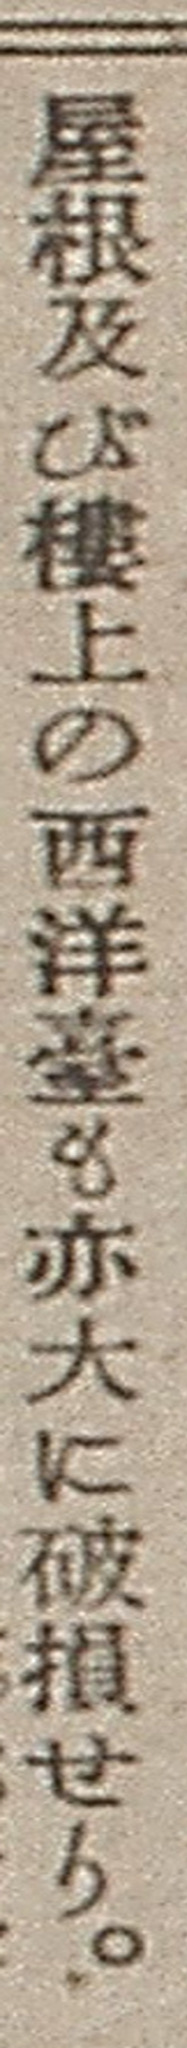屋根及び楼上の西洋台も亦大に破損せり。
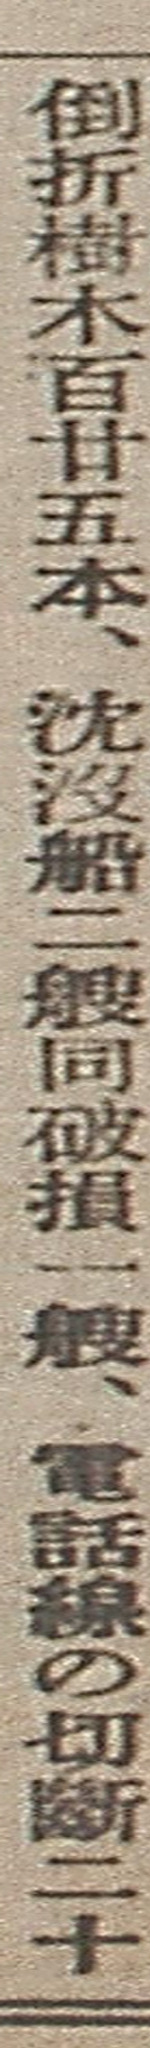倒折樹木百廿五本、沈没船二艘同破損一艘、電話線の切断二十
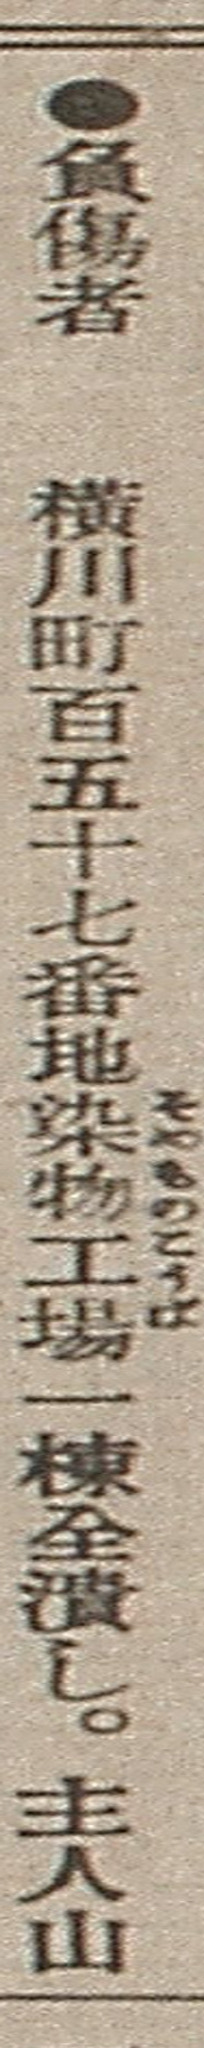●負傷者横川町百五十七番地染物工場一棟全潰し。主人山
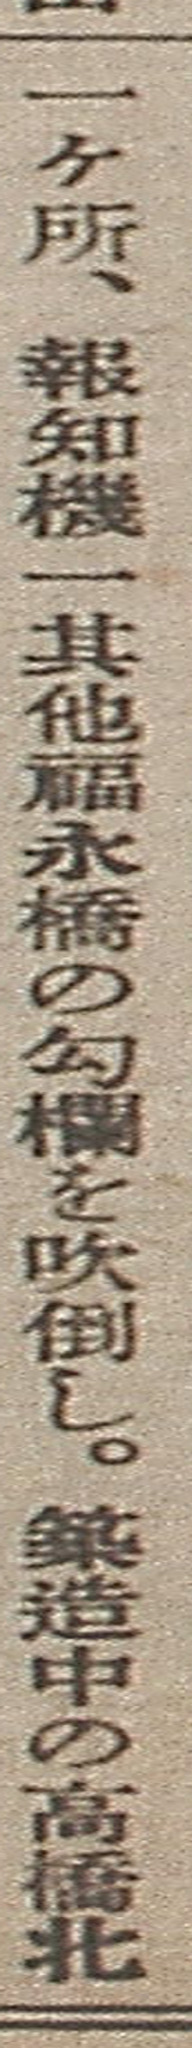一ケ所、報知機一其他福永橋の勾欄を吹倒し。築造中の高橋北
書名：風俗畫報臨時増刊第百九十九號　明治三十二年十月各地災害圖會（前編之續）
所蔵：東京大学地震研究所図書室 Earthquake Research Institute Library, The University of Tokyo, JAPAN
